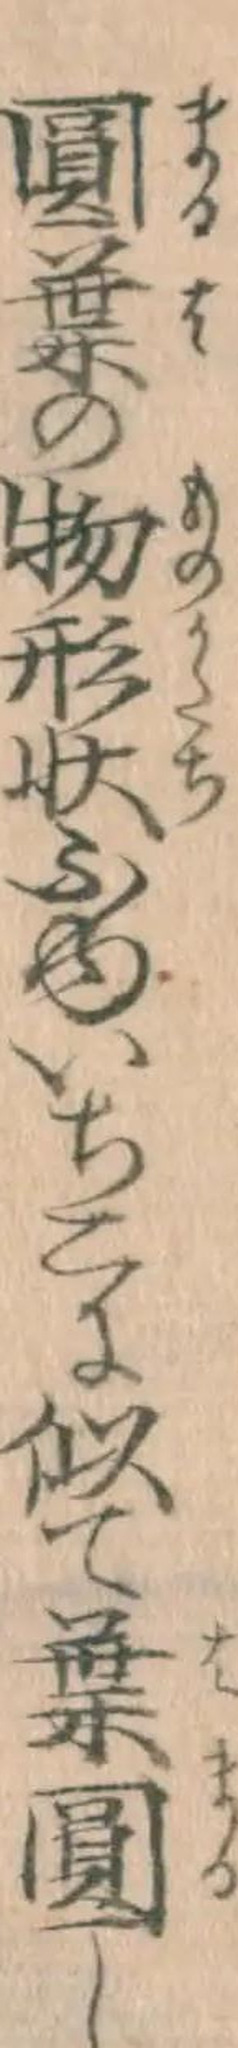円葉の物形状ふゆいちこに似て葉円し
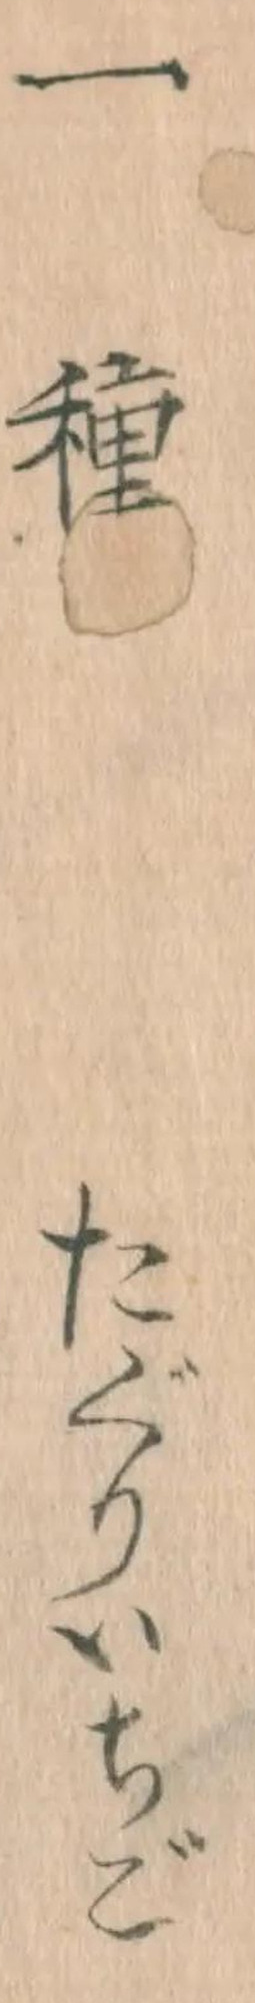一種たぐりいちご
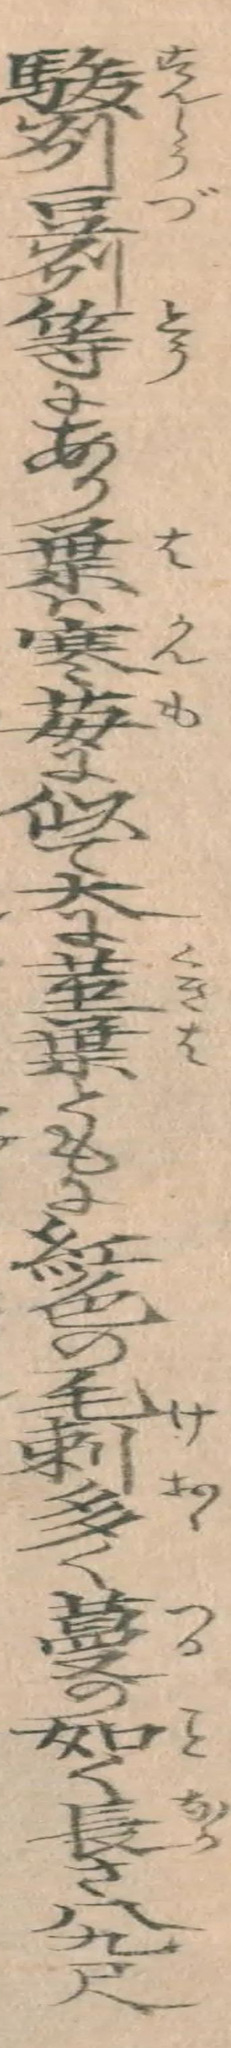駿州豆州等にあり葉は寒苺に似て大に茎葉ともに紅色の毛剌多く蔓の如く長さ八九尺
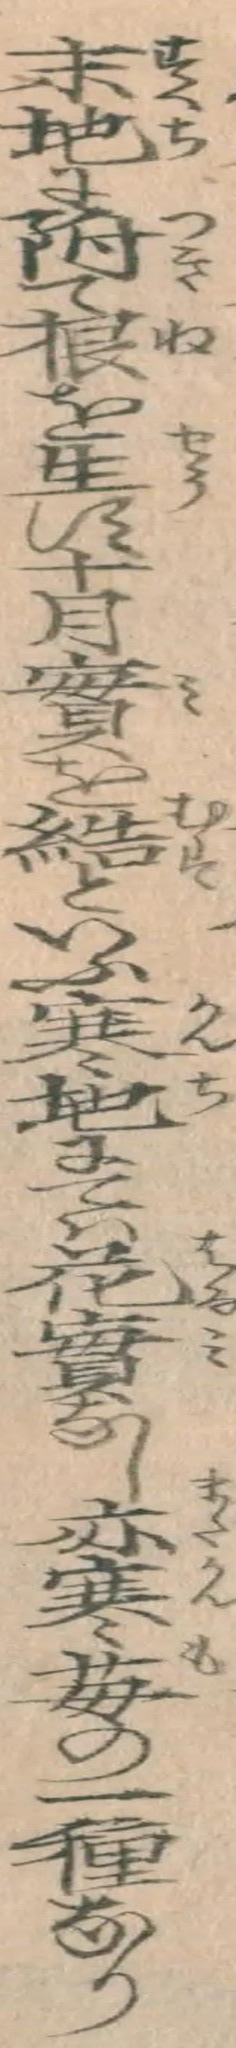末地に附て根を生す十月実を結といふ寒地にては花実なし亦寒苺の一種なり

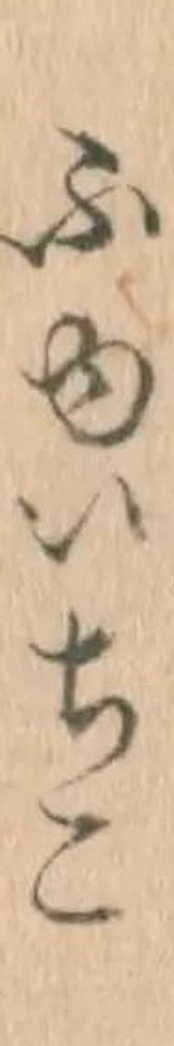ふゆいちこ
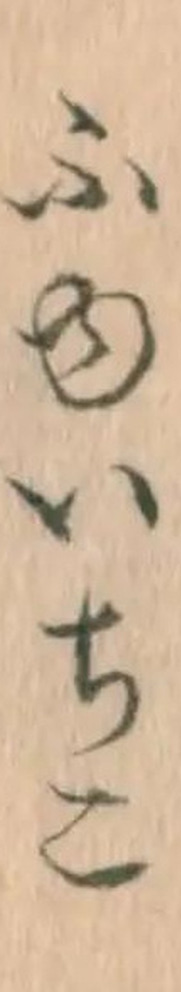ふゆいちこ

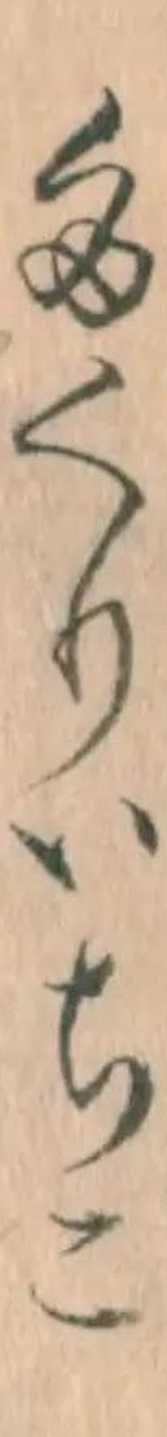たぐりいちご

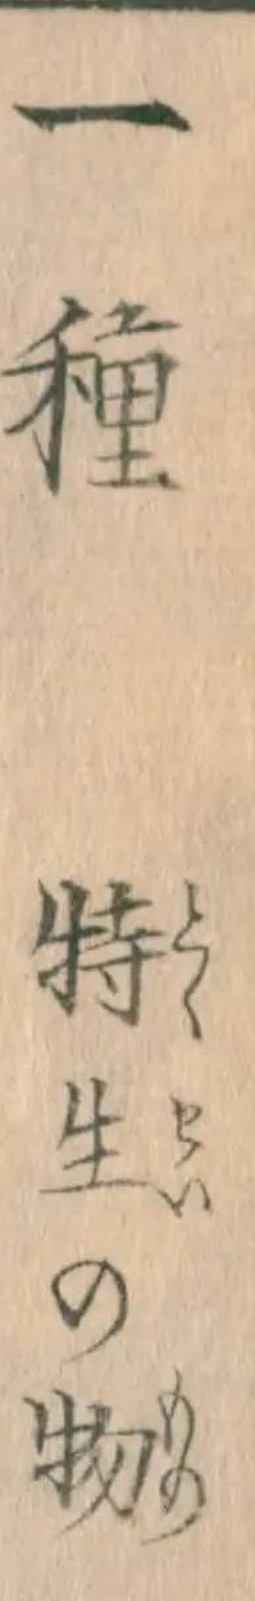一種特生の物
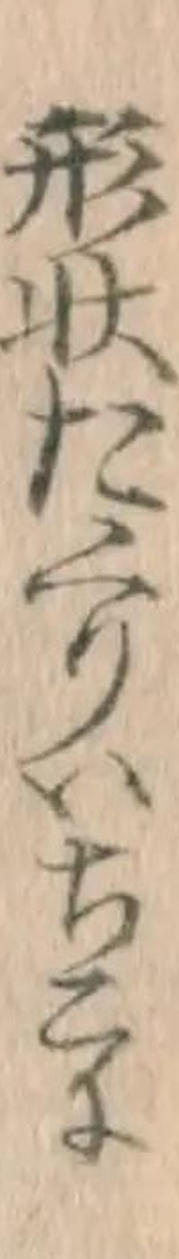形状たくりいちこに
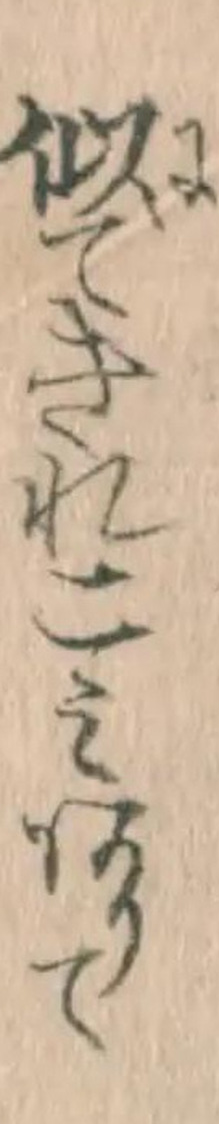似てきれこみありて
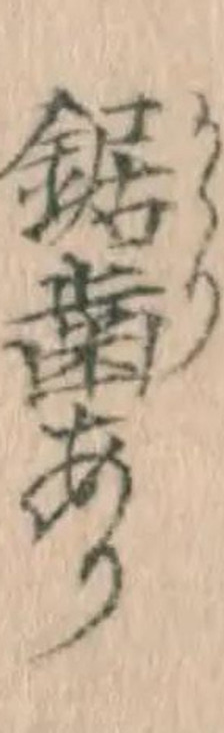鋸歯あり
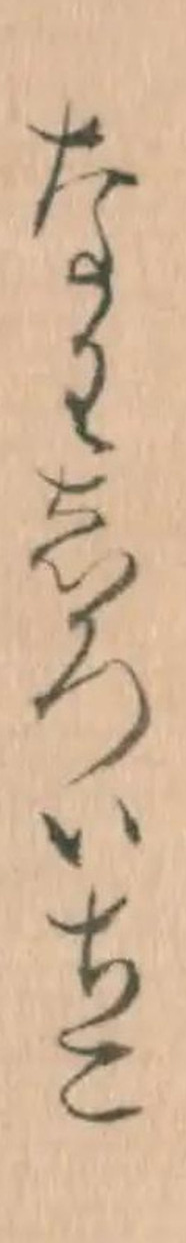なわしろいちこ
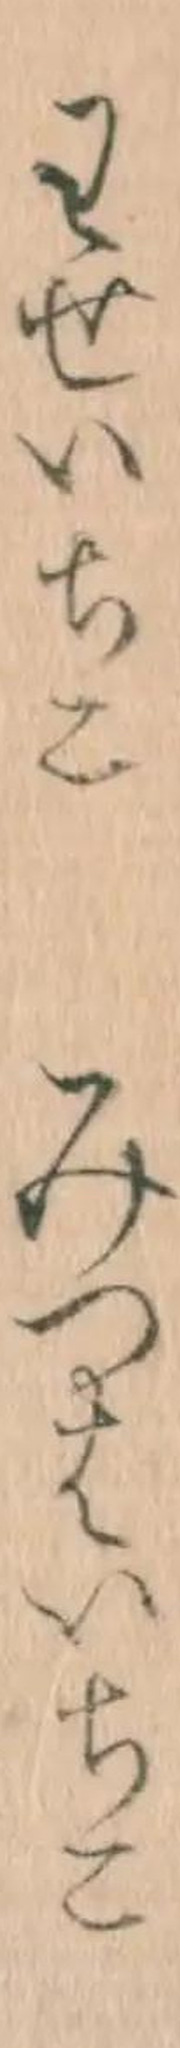わせいちこみつはいちこ
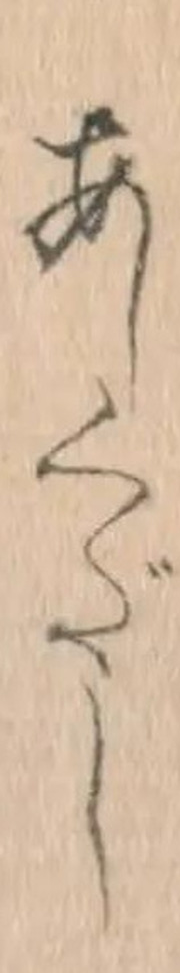あしくだし
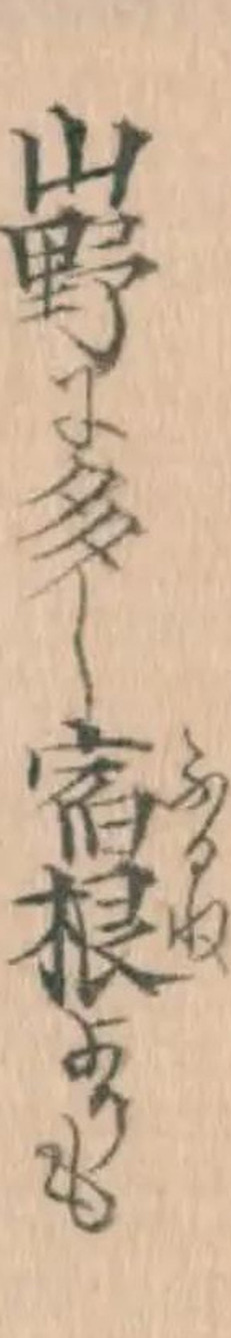山野に多し宿根よりも
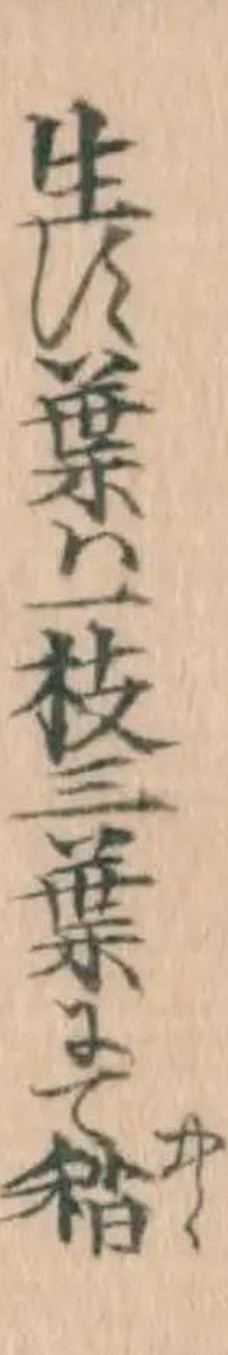生す葉は一枝三葉にて稍
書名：本草図譜. 巻25-27
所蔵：国立国会図書館 National Diet Library, JAPAN
